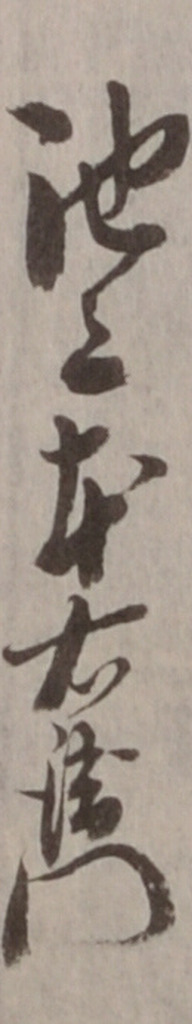池上本右衛門
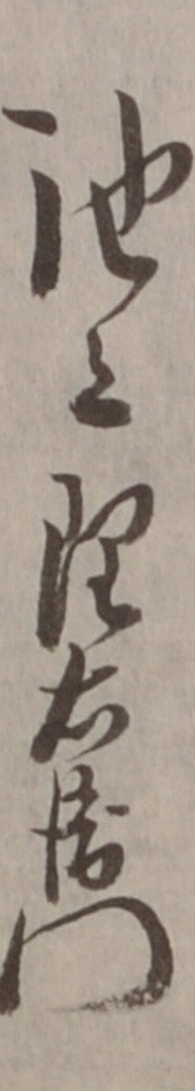池上理右衛門
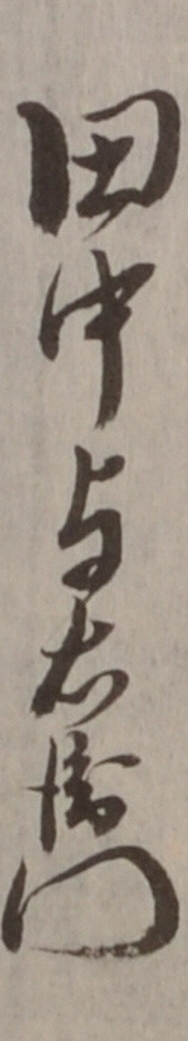田中与右衛門
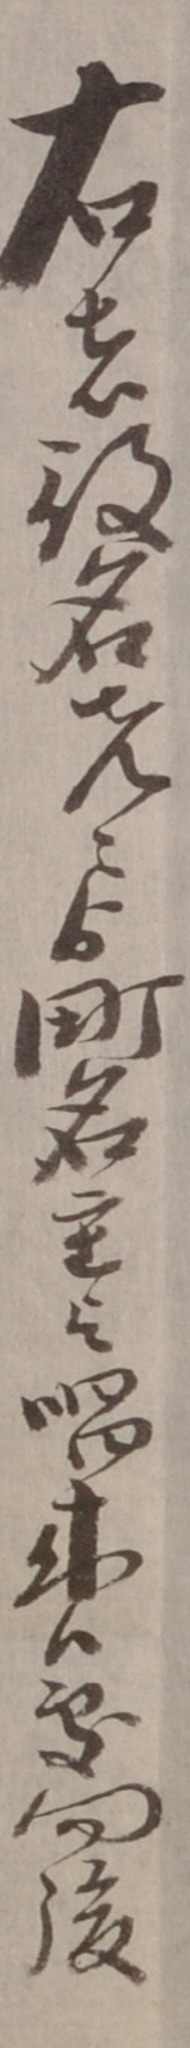右は役名先ニゟ町名主と唱来候処向後
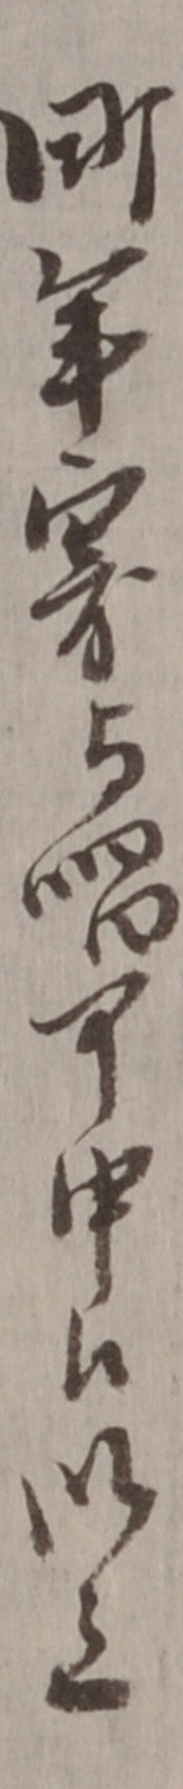町年寄と唱可申候以上
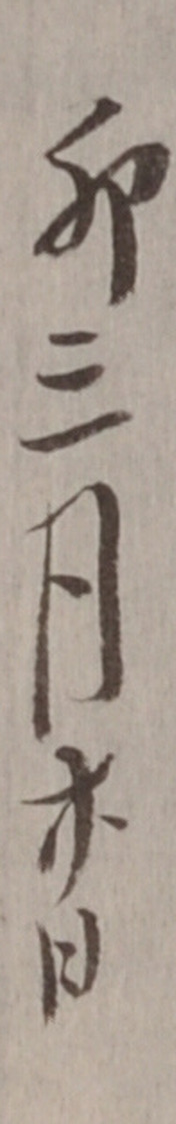卯三月廿日
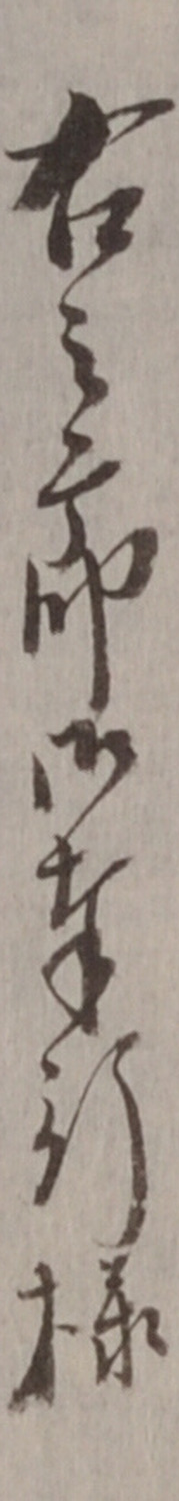右之節御奉行様
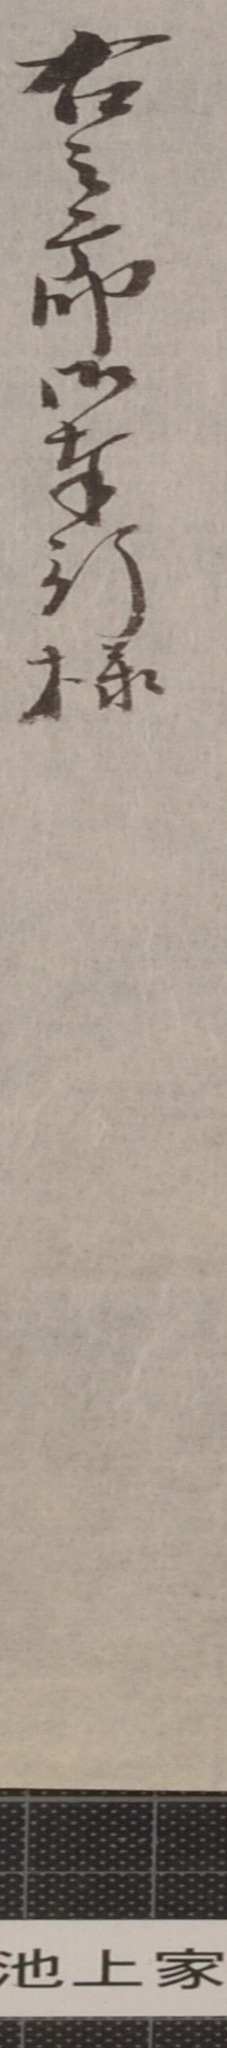右之節御奉行様
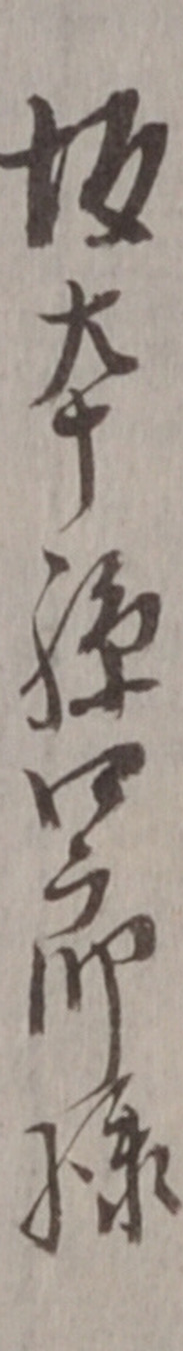坂本孫四郎様
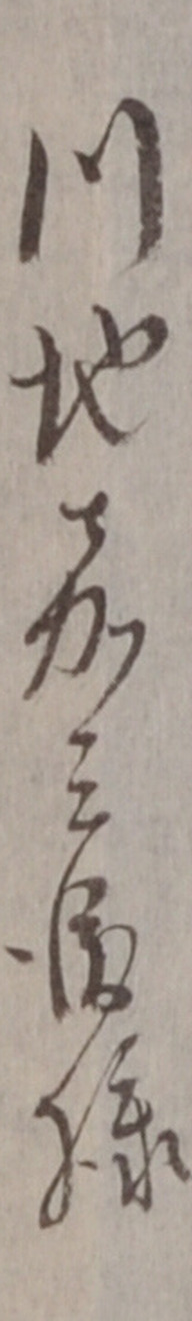川地嘉兵衛様
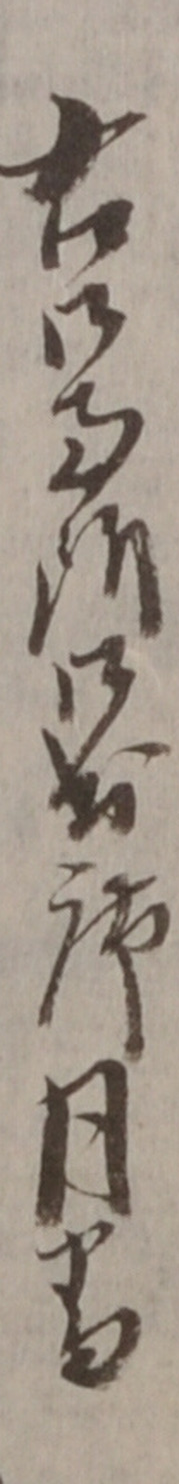右御両所御出席月番
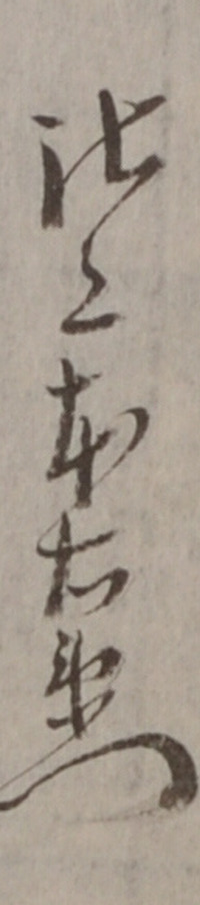池上本右衛門
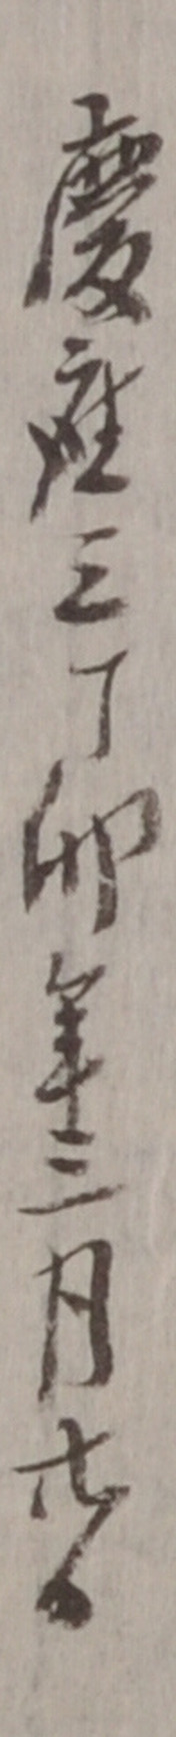慶応三丁卯年三月廿日
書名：（書付）
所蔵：伊那市立高遠町図書館・合同会社AMANE
